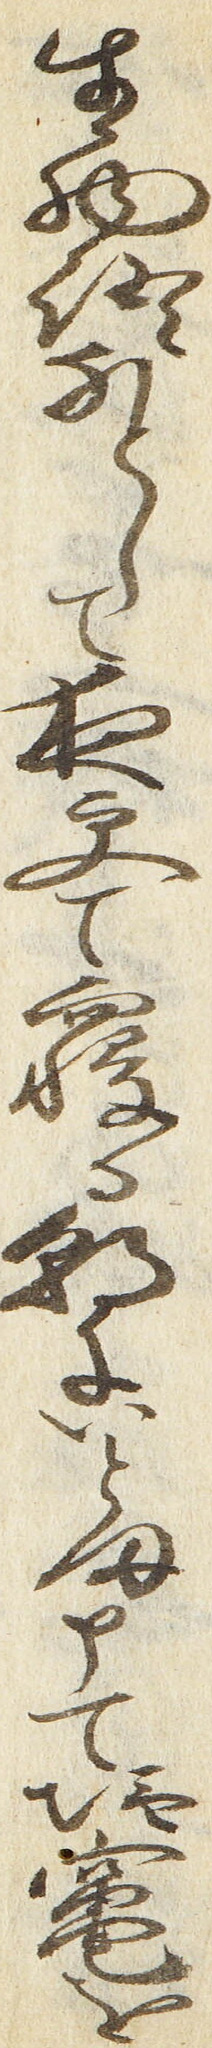生物語なとして夜更て寝る朝にいとま申て塩竃を
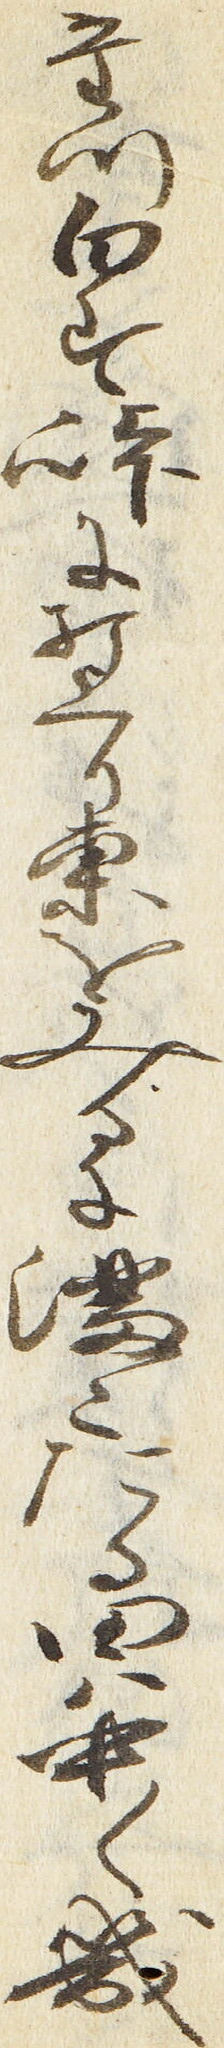たつ白す峠に打上り東をみるに満々たる田は中〳〵幾
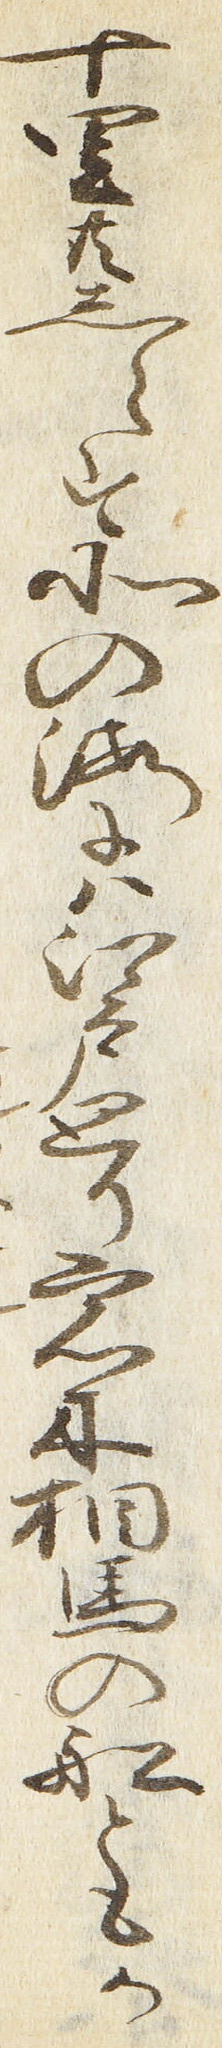十里共しらす北の海には江戸廻り岩木相馬の船ともか
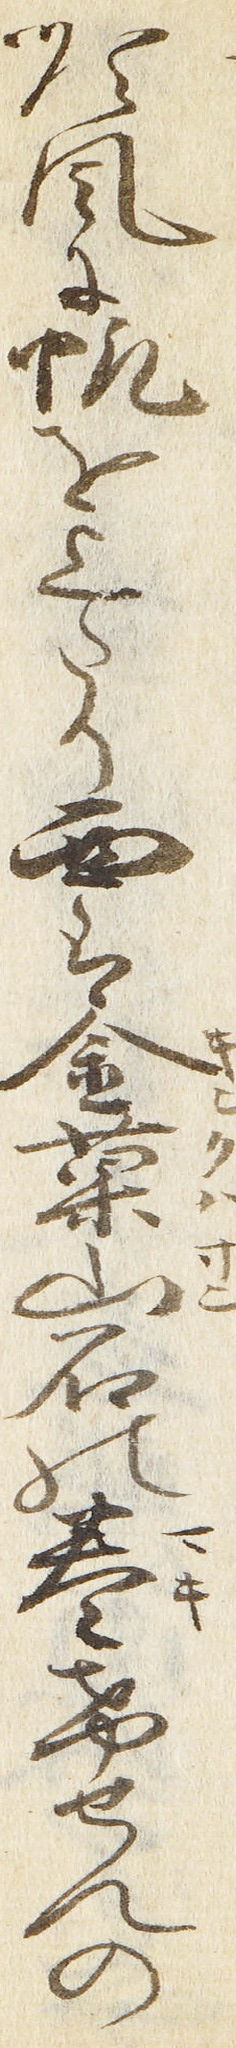順風に帆を上たり西は金菓山石の巻けせんの
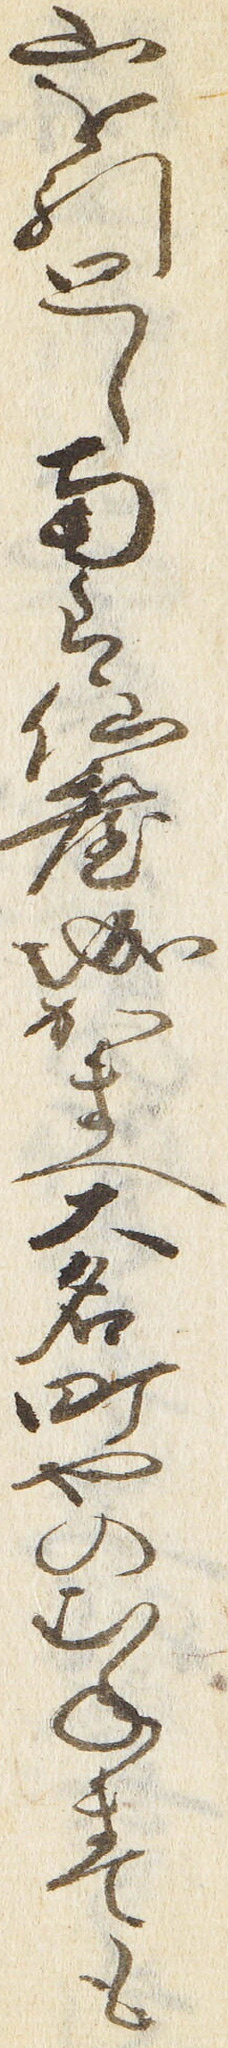山を引廻し南は仙台城かまへ大名町やのむねまても
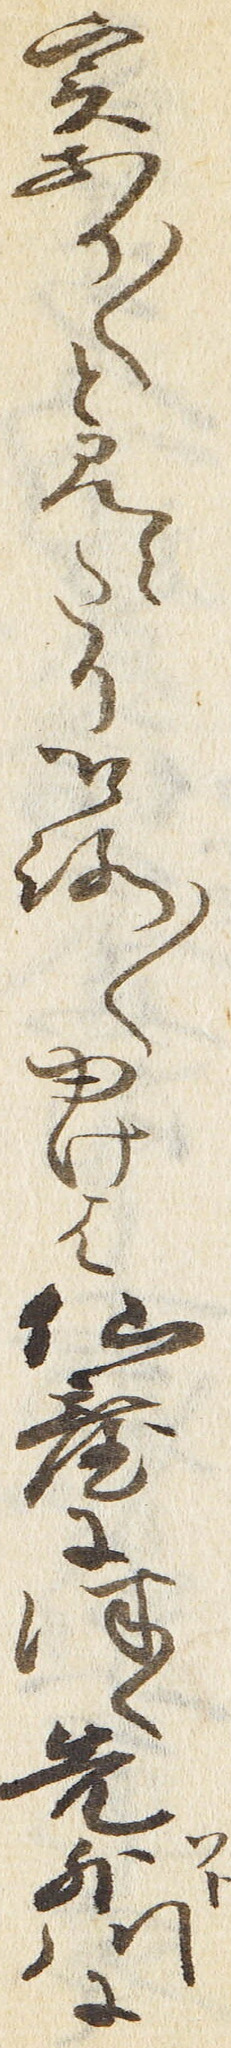実あり〳〵と見えたりそろ〳〵ゆけは仙台につく先外川に
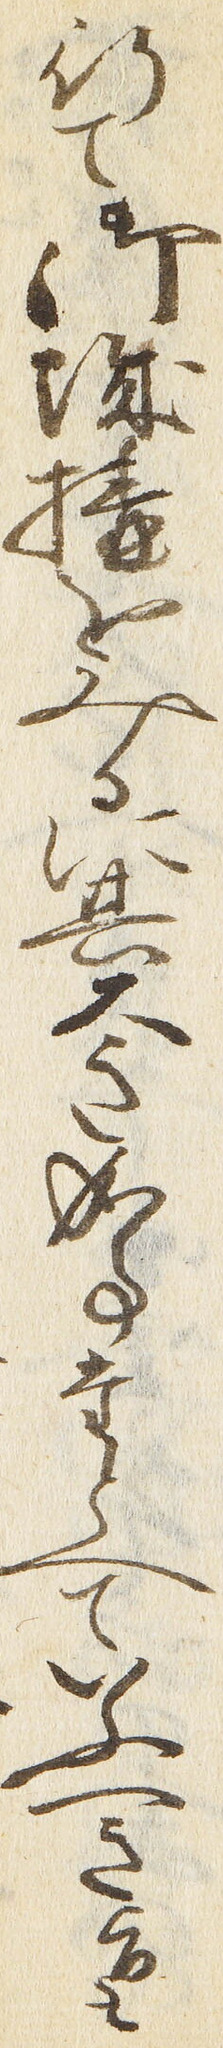行て御城構をみるに其大き成事たとへていふへき方も
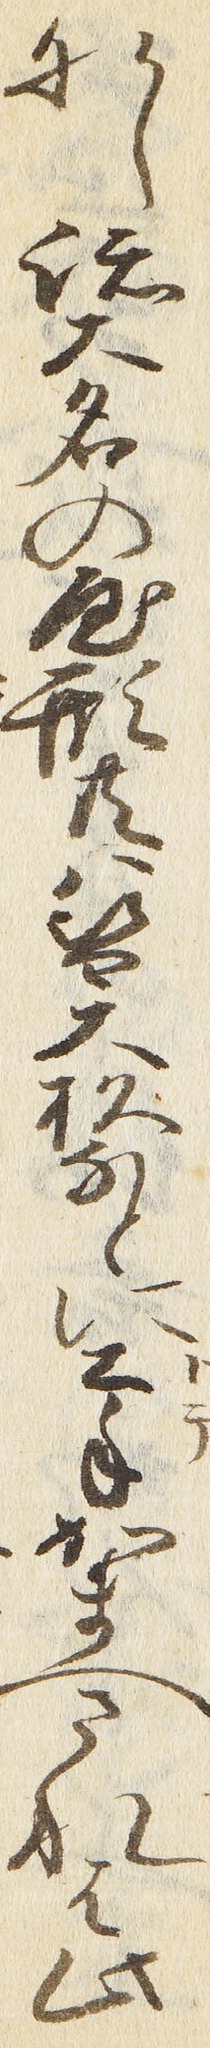なし諸大名の屋形共は皆大杉なとに土手かまへされは此
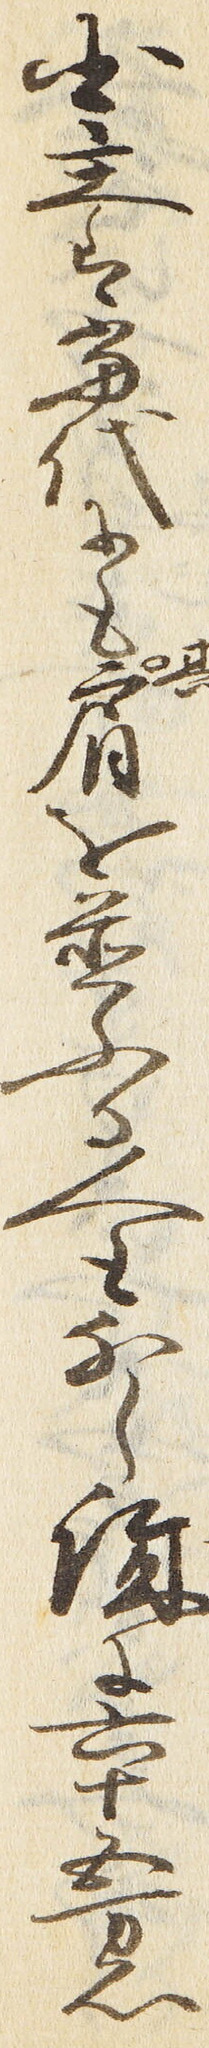国主は当代にも其肩を並ふる人もなし誠に六十五万石
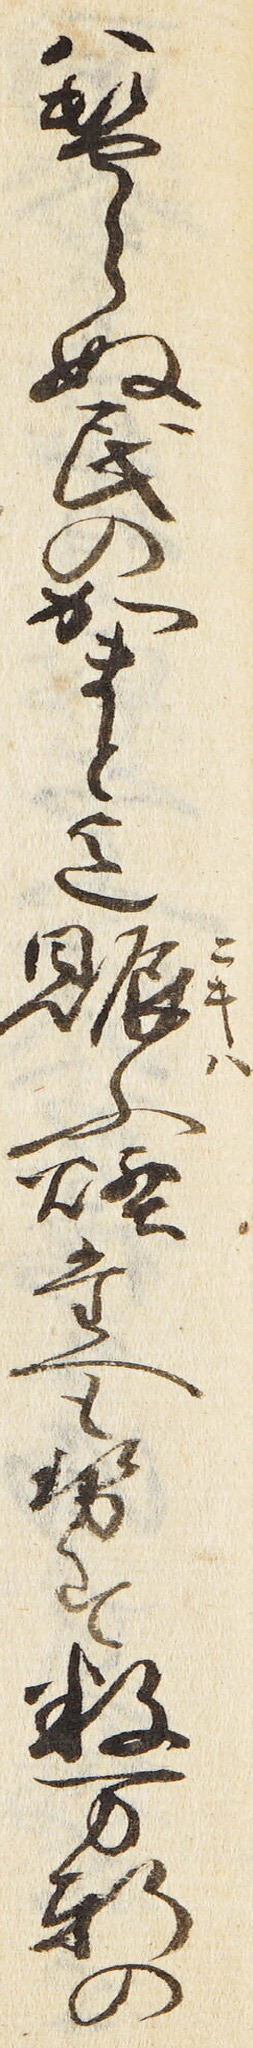は替らぬ民のかまと迄賑ふ煙たへもせす数万軒の
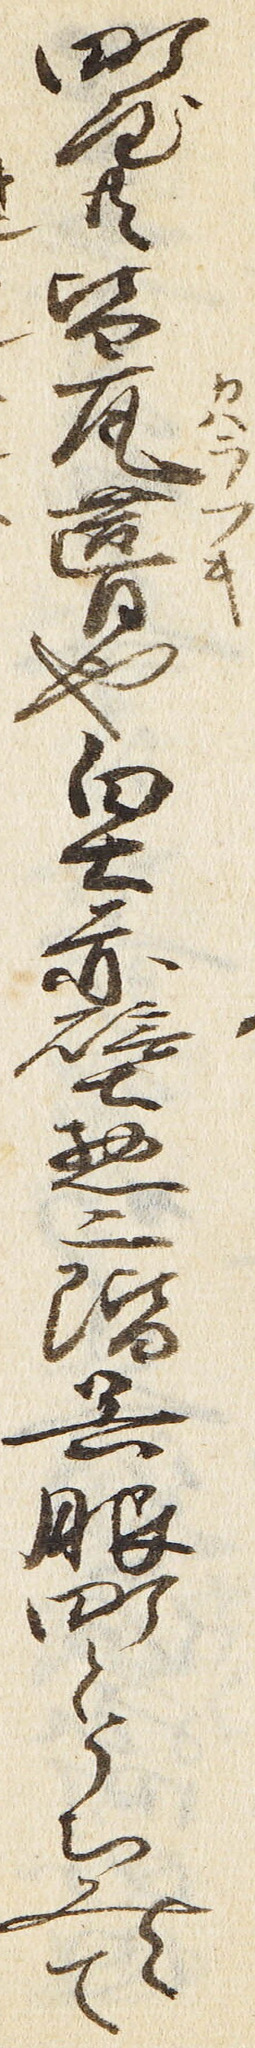町屋共皆瓦葺や白土赤壁惣二階呉服町とうちみえて
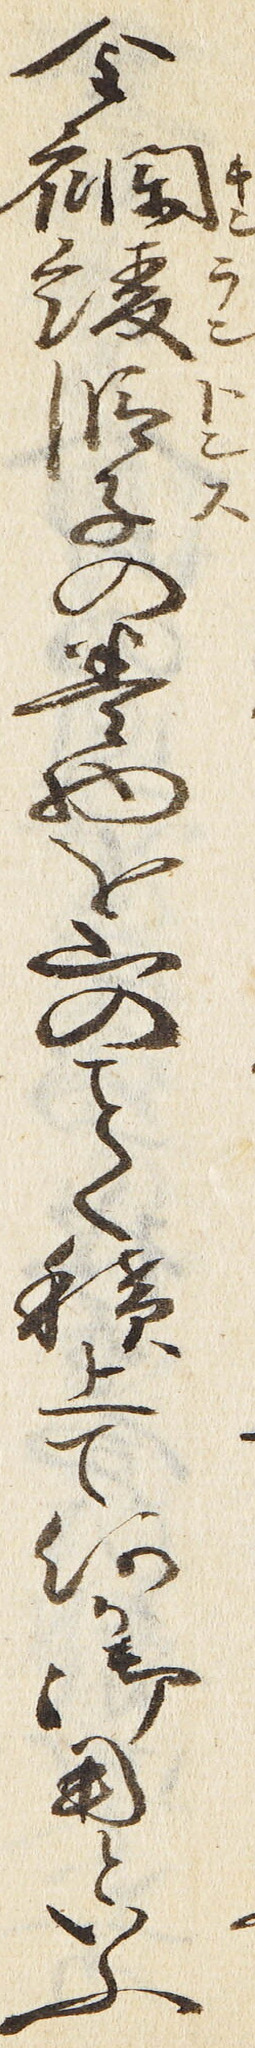金襴綾段子の巻物を山のことく積上て何か御用といふ
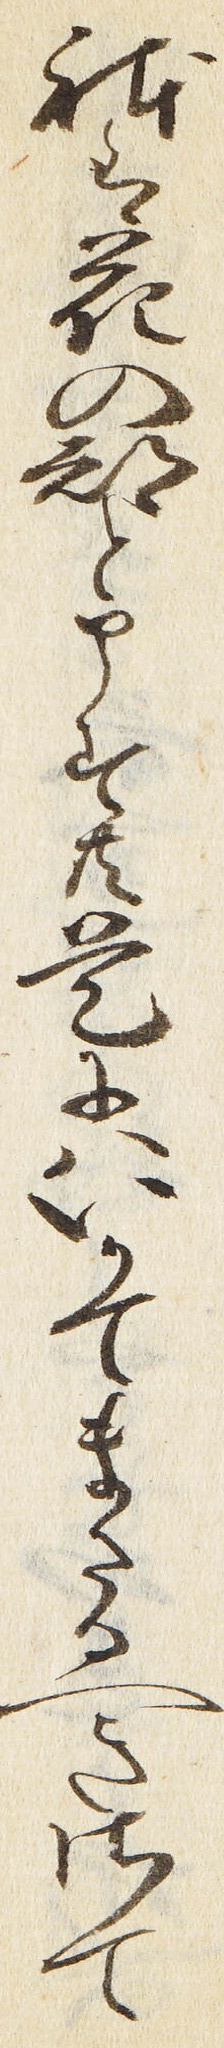体は花の都と申す共是にはいかてまさるへきさて
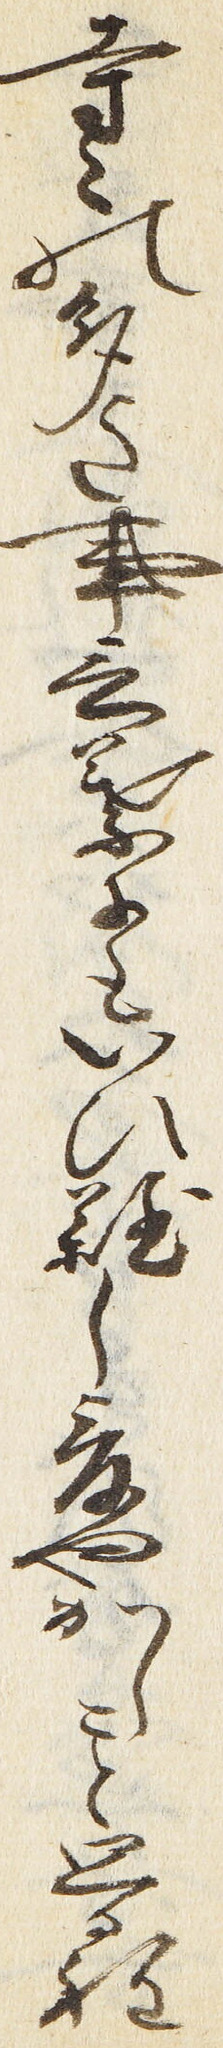寺々の多き事言葉にもいひ難し爰やかしこと廻る程
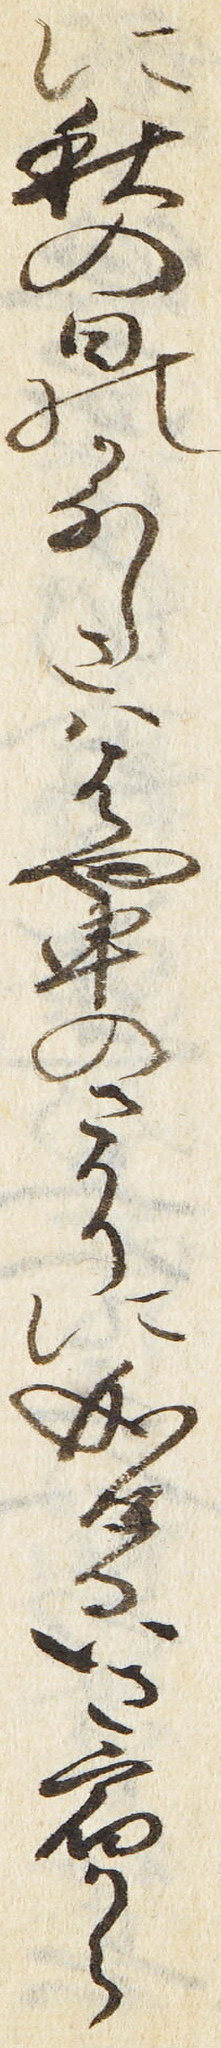に秋の日のかなしさははや申のさかりに成けるいさ宿から
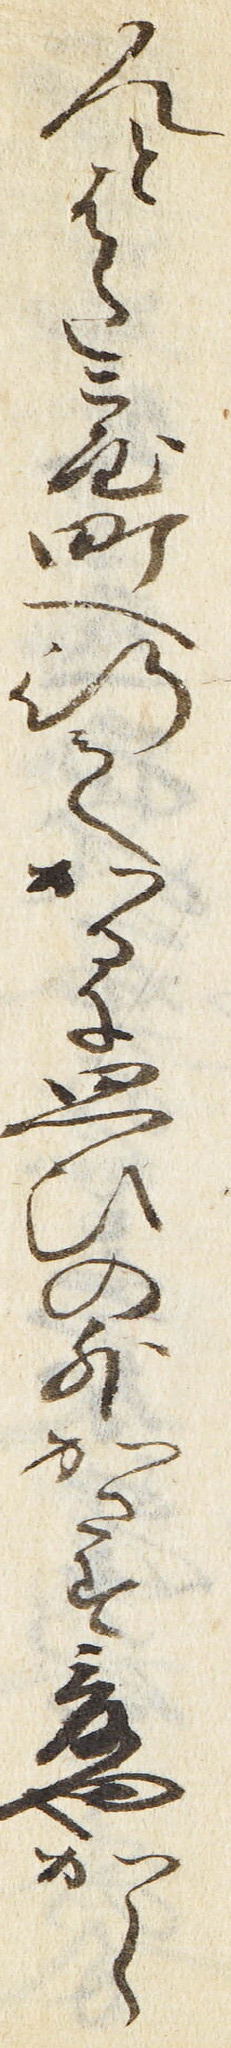んとはたこ屋町へ行てかるに思ひの外かさす爰やかし
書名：海陸世話日記
